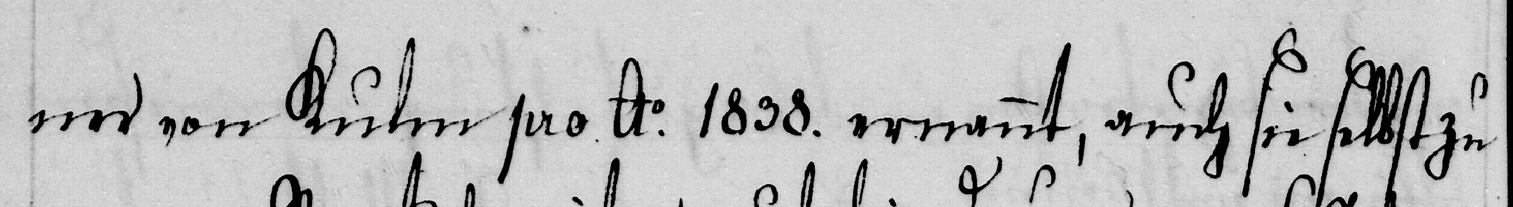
ner von Kulm pro Ao. 1838 ernannt, auch sie selbst zu
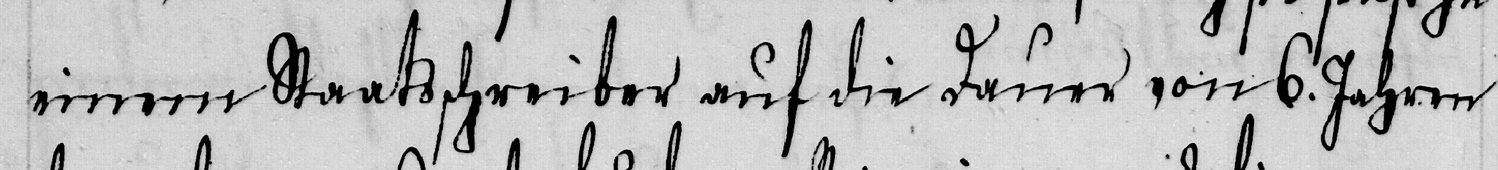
einem Staatsschreiber auf die Dauer von 6. Jahren
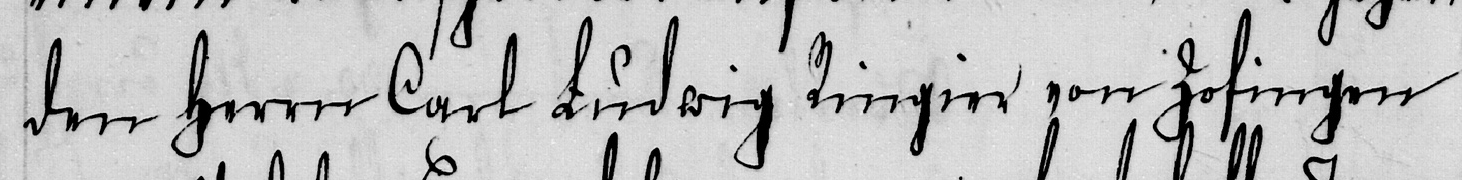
den Herrn Carl Ludwig Ringier von Zofingen
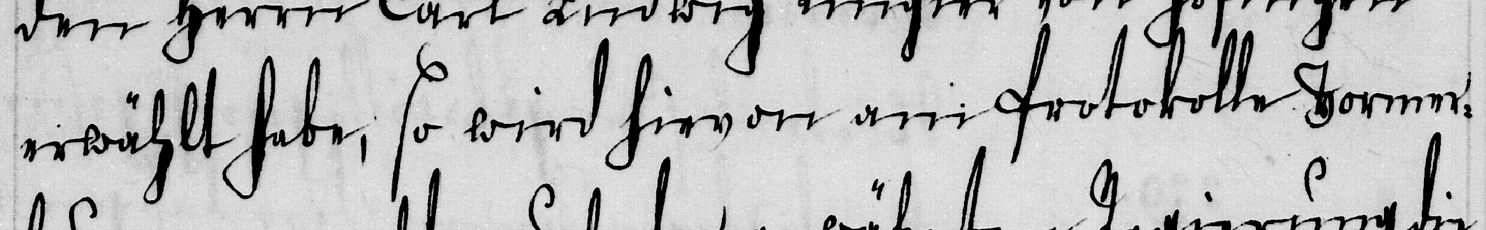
erwählt habe, so wird hievon am Protokolle Vormer¬
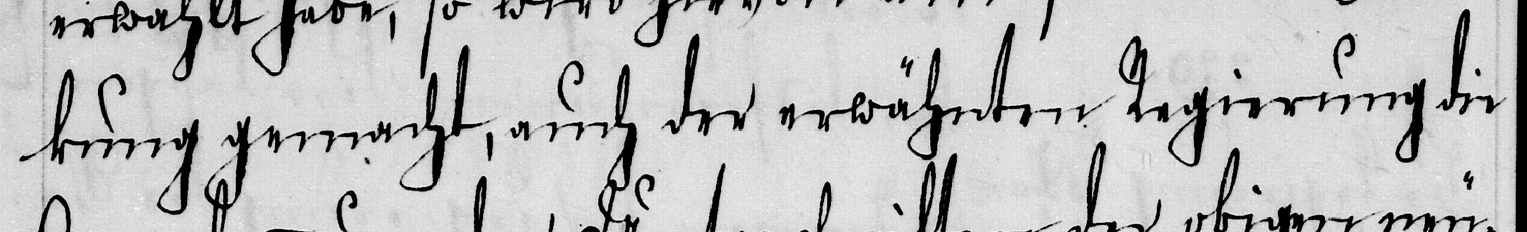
kung gemacht, auch der erwähnten Regierung die
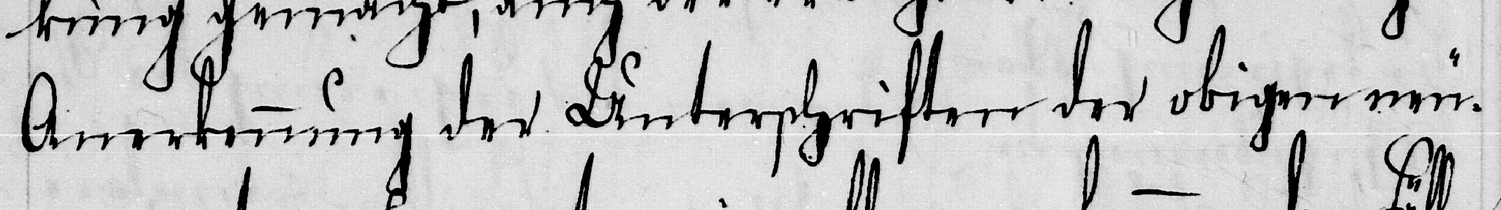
Anerkennung der Unterschriften der obigen neu¬
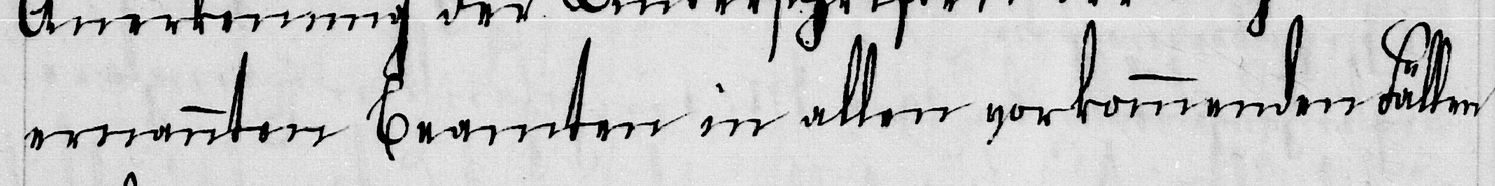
ernannten Beamten in allen vorkommenden Fällen
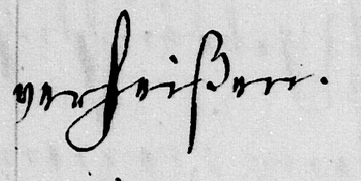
verheißen.
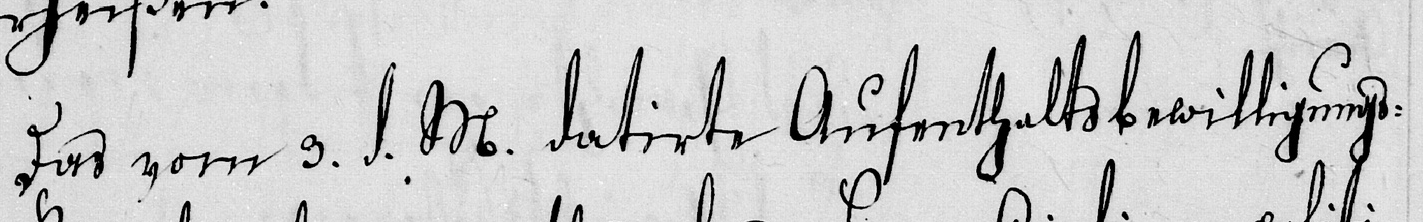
Das vom 3. d. M. datirte Aufenthaltsbewilligung¬
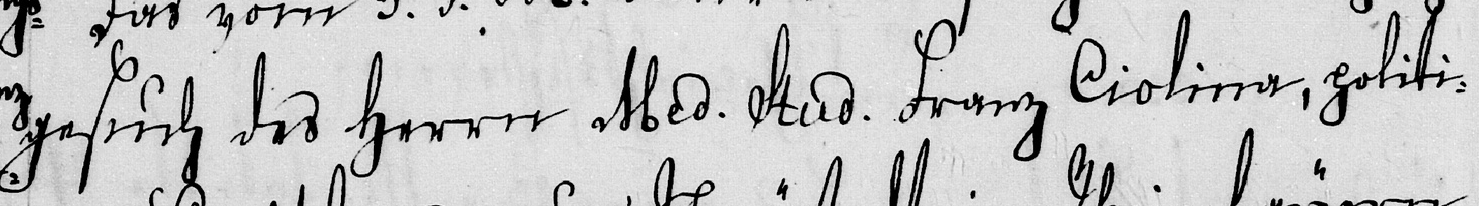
sgesuch des Herrn Med. Stud. Franz Ciolina, politi¬
